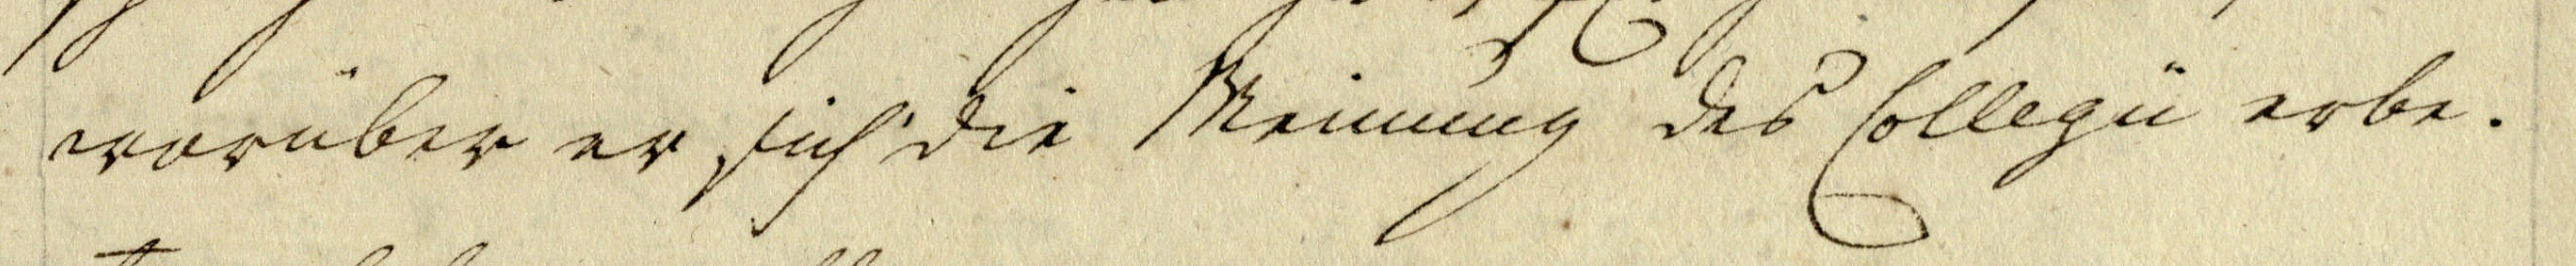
worüber er sich die Meinung des Collegii erbe
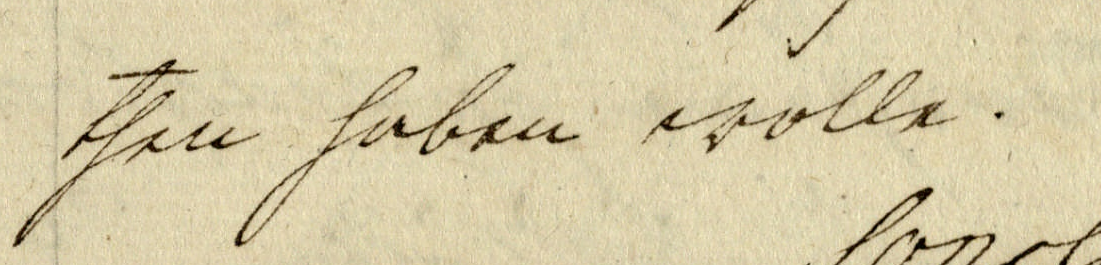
then haben wolle.
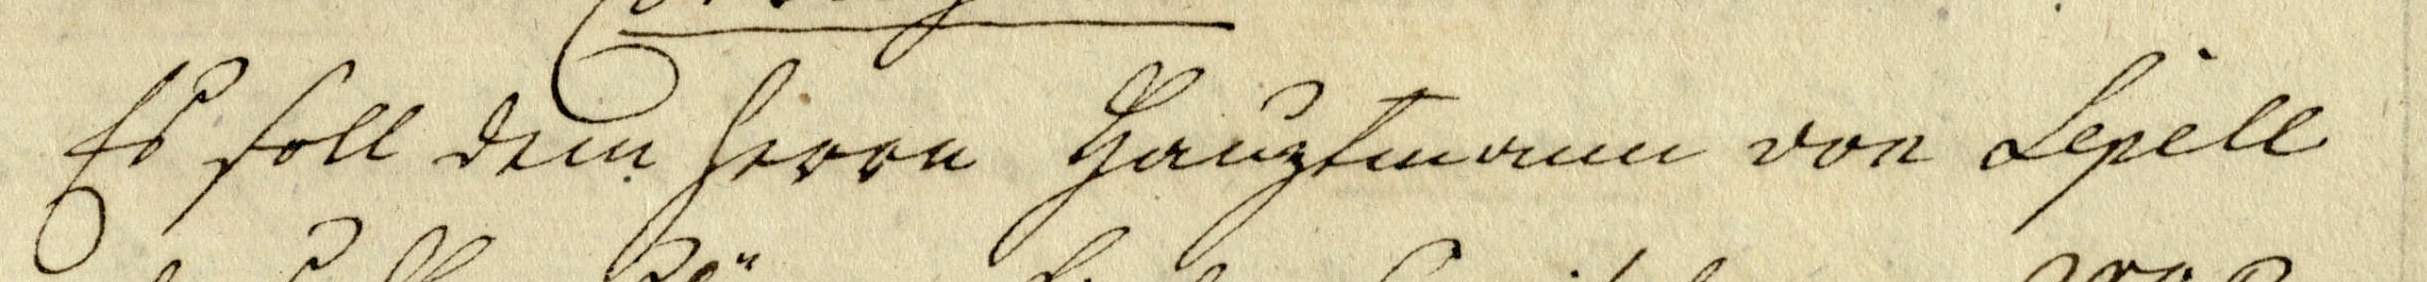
Es soll dem Herrn Hauptmann von Lepell
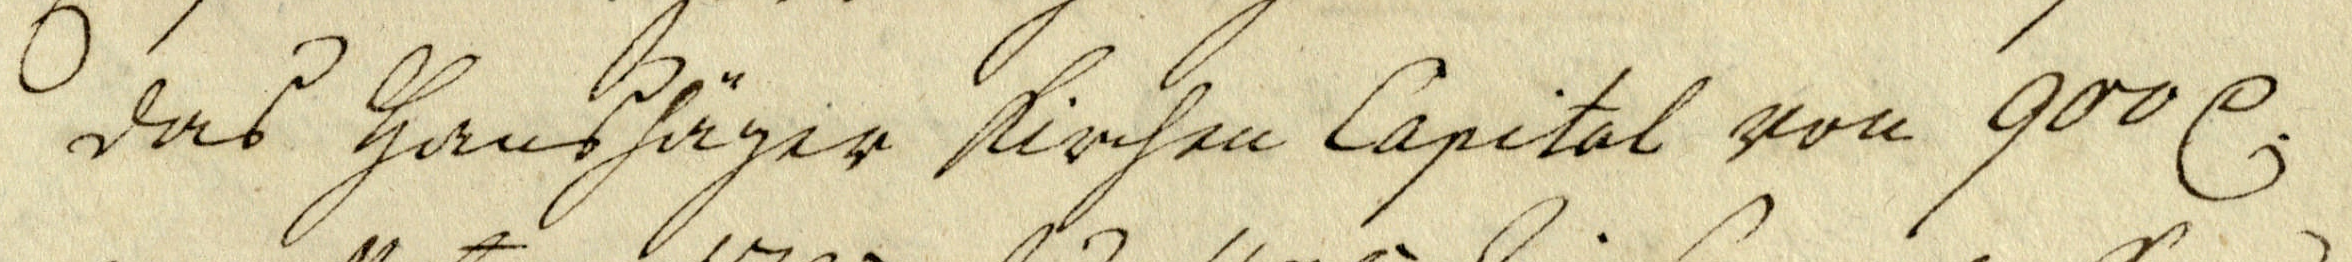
das Hanshäger Kirchen Capital von 900 l.
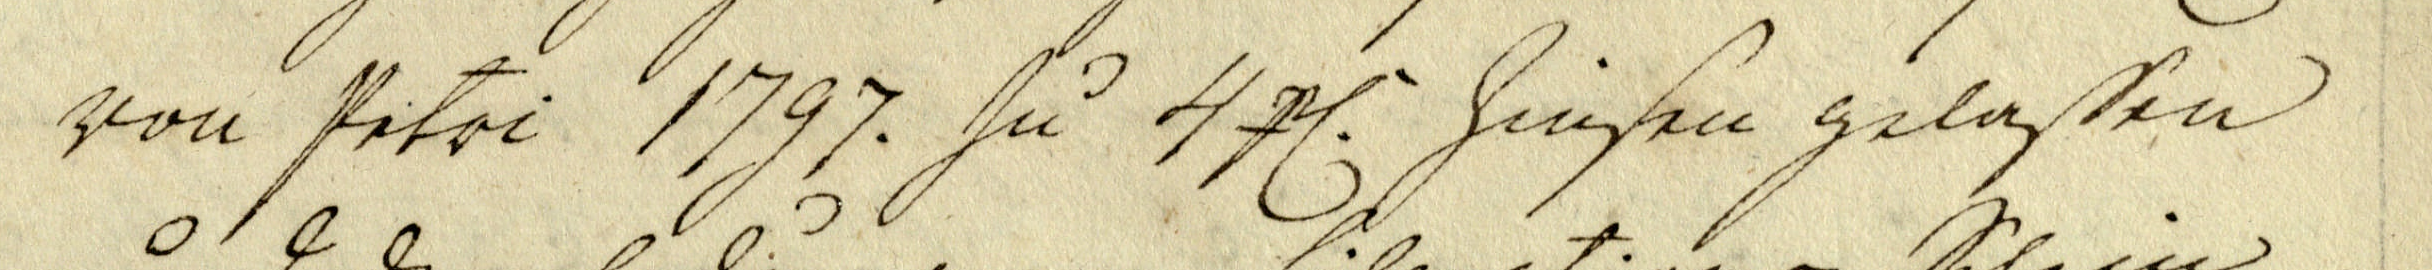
von Petri 1797. zu 4 pl. Zinsen gelassen
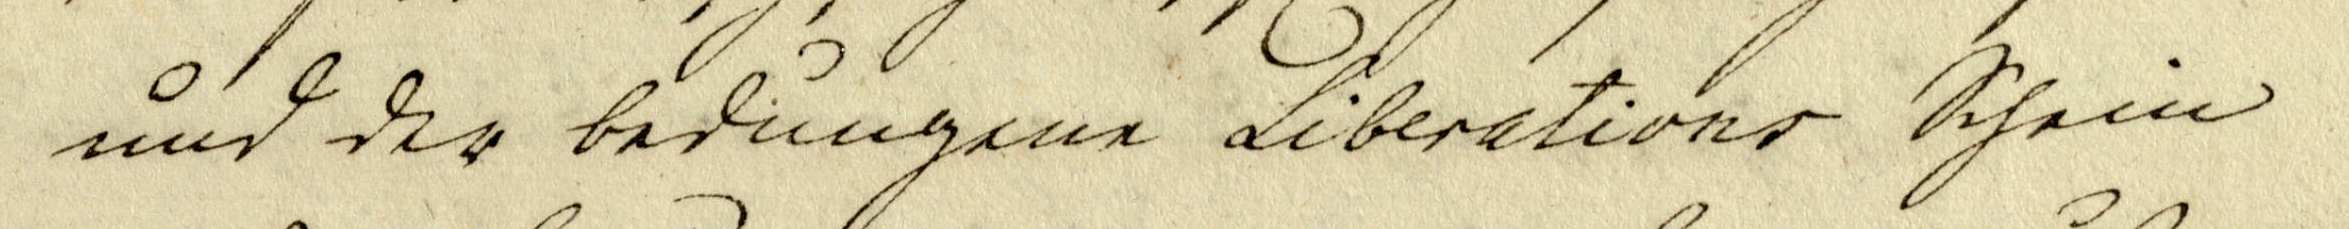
und der bedungene Liberations Schein
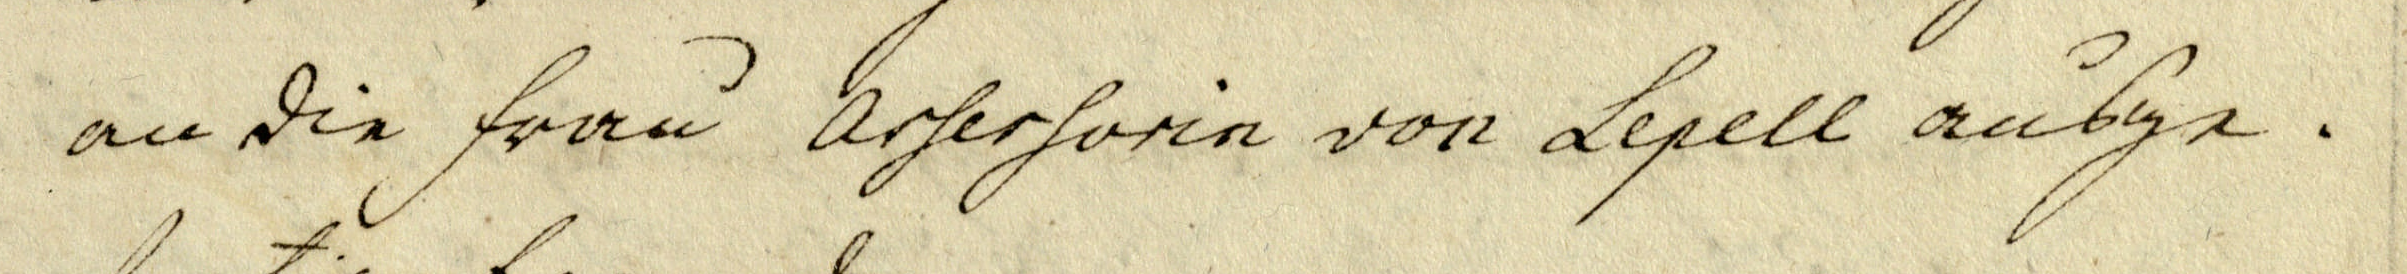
an die Frau Assessorin von Lepell ausge¬
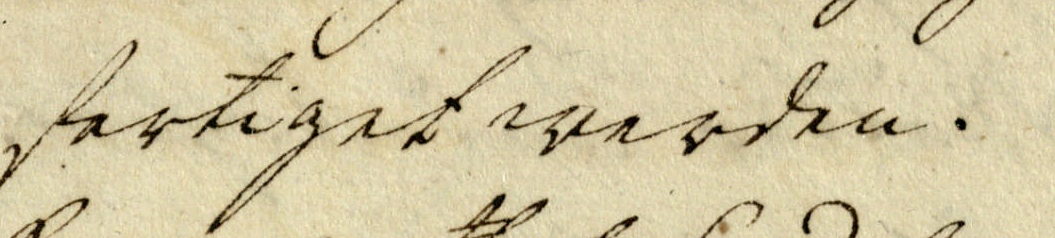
fertiget werden.
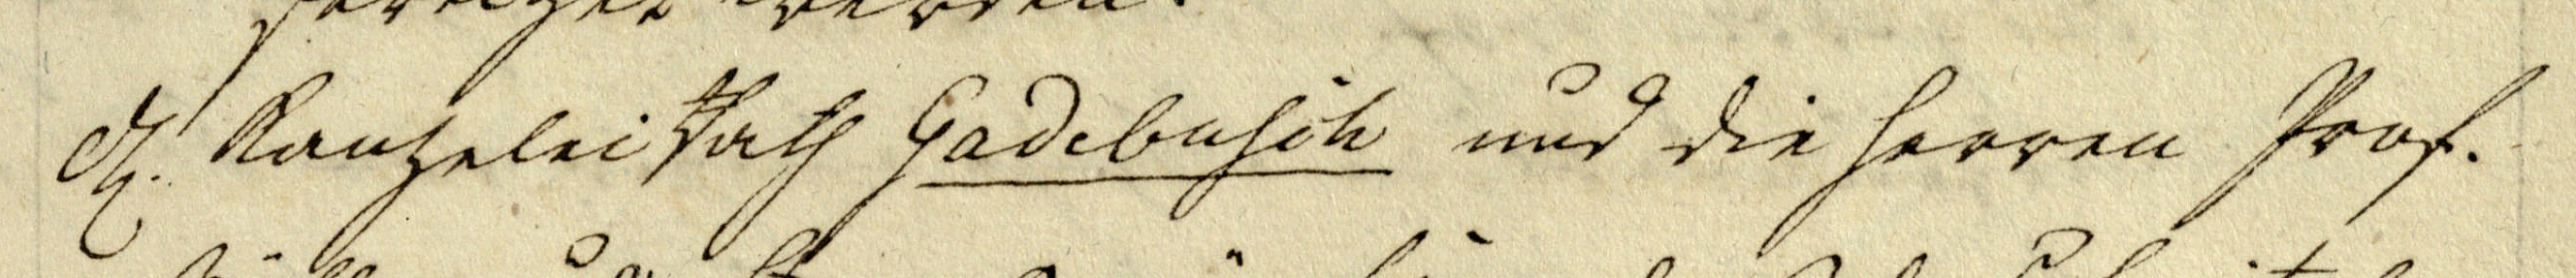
dh. Kanzelei Rath Gadebusch und die Herren Prof.
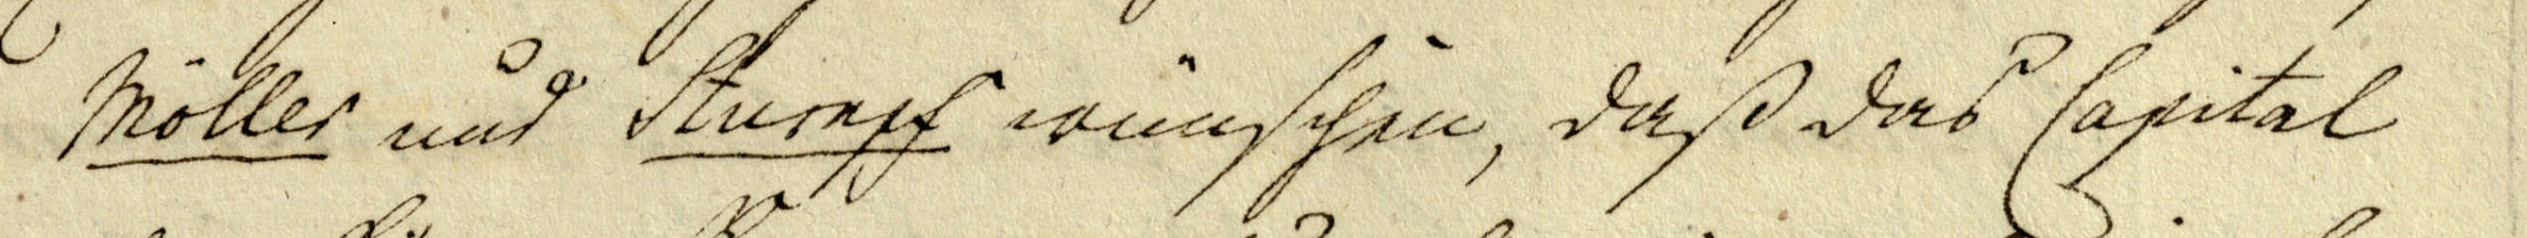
Möller und Stumpf wünschen, daß das Capital
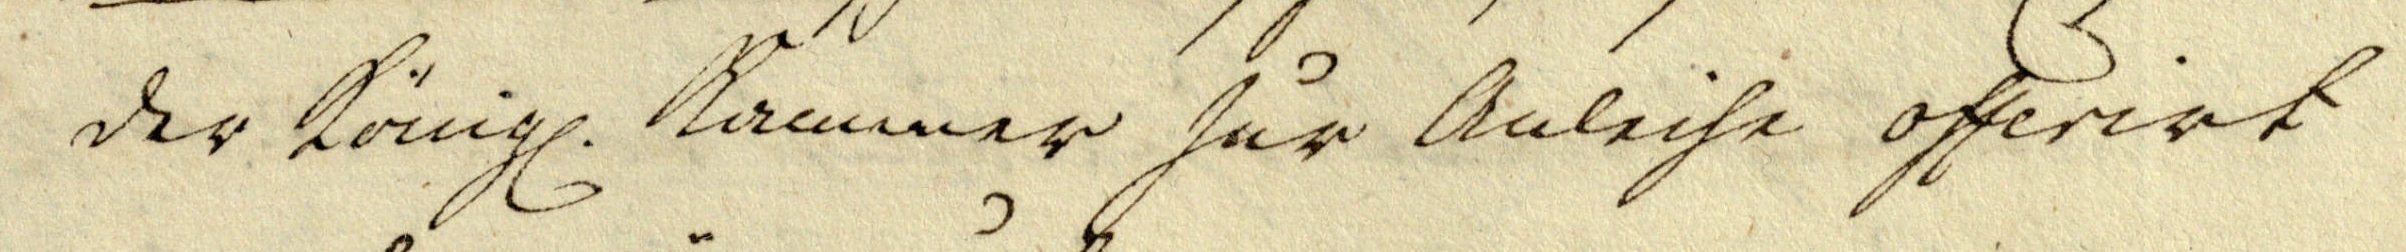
der Königl. Kammer zur Anleihe offerirt
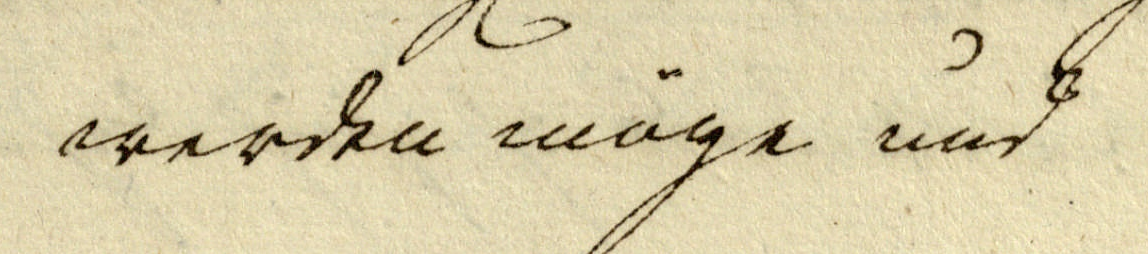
werden möge und
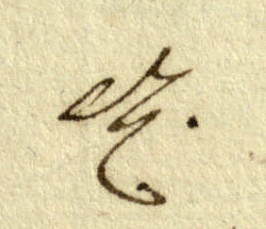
dh.
